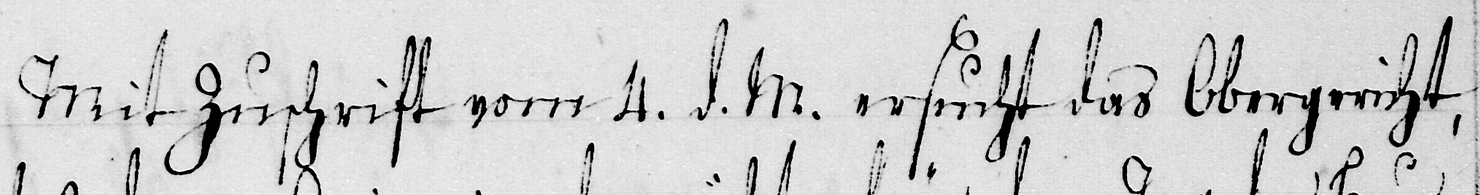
Mit Zuschrift vom 4. d. M. ersucht das Obergericht,
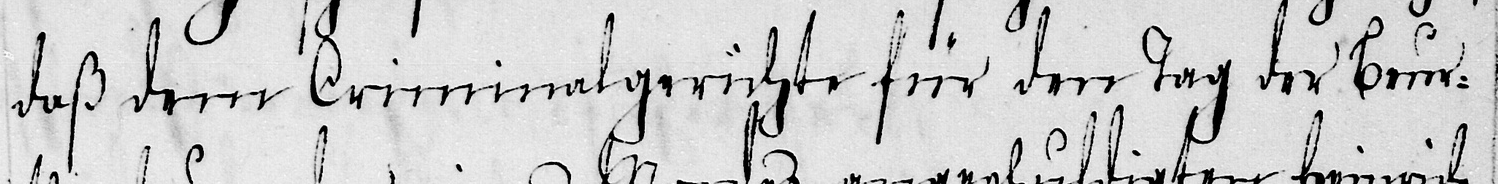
daß dem Criminalgerichte für den Tag der Beurt¬
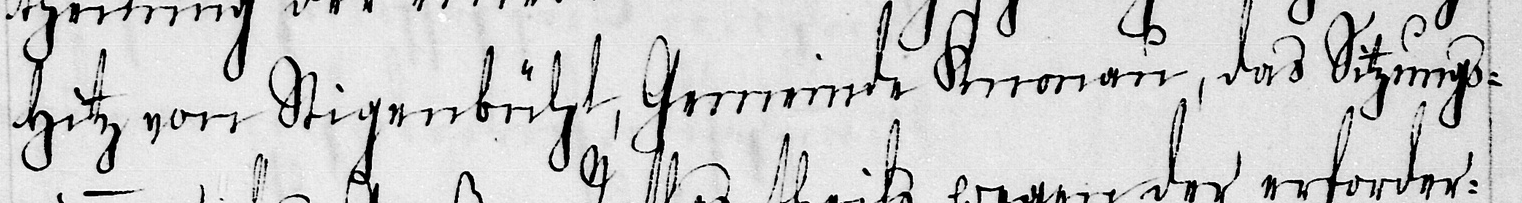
Hitz von Stigenbühl, Gemeinde Knonau, das Sitzungs¬
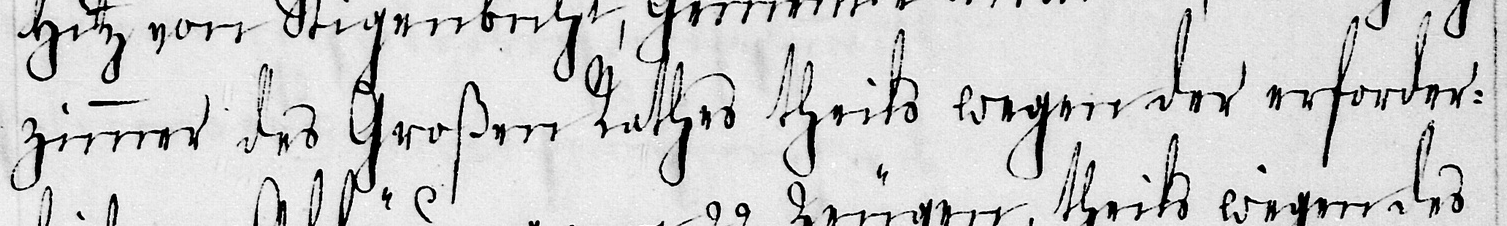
zimmer des Großen Rathes theils wegen der erforder¬
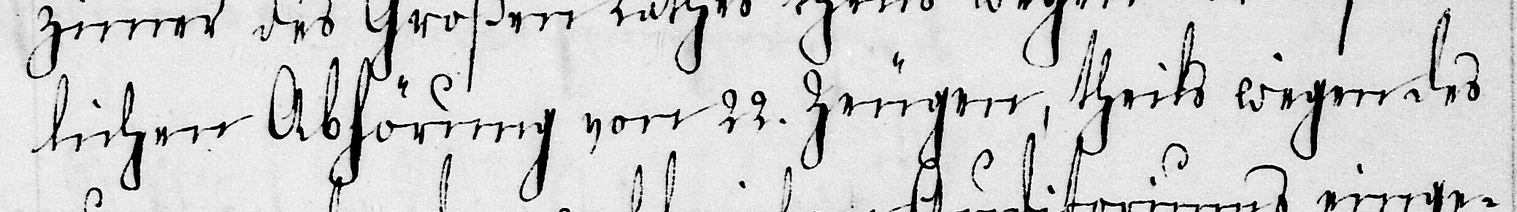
lichen Abhörung von 22. Zeugen, theils wegen des
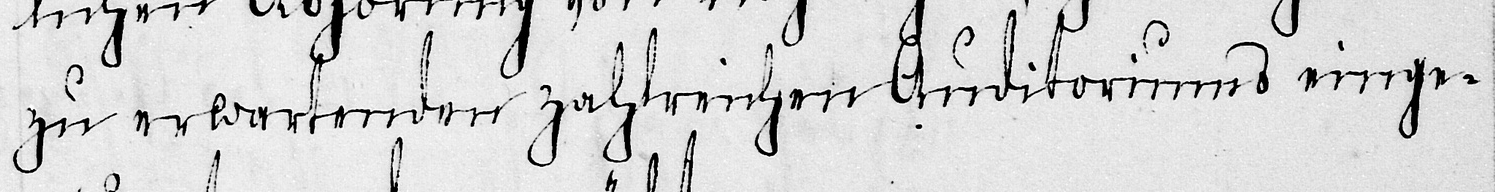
zu erwartenden zahlreichen Auditoriums einge¬
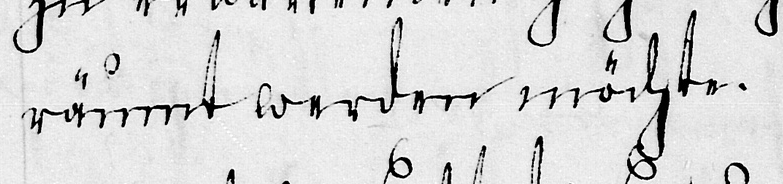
räumt werden möchte.
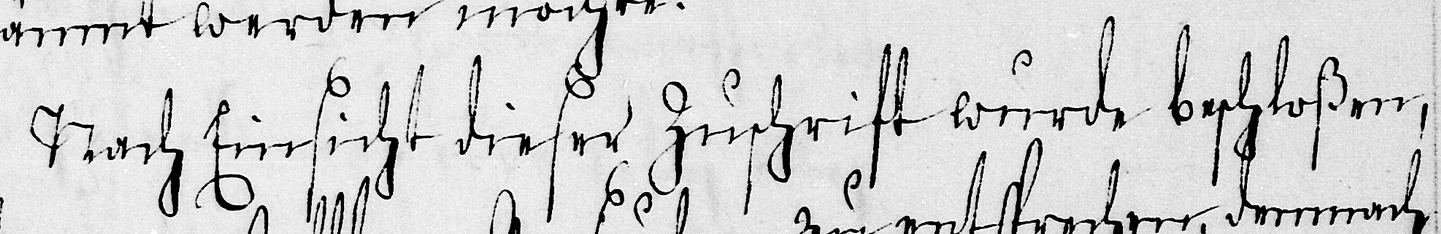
Nach Einsicht dieser Zuschrift wurde beschloßen,
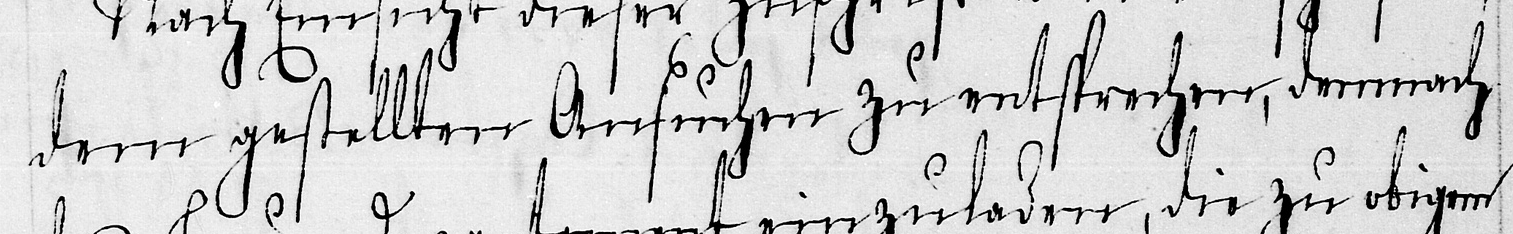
dem gestellten Ansuchen zu entsprechen, demnach
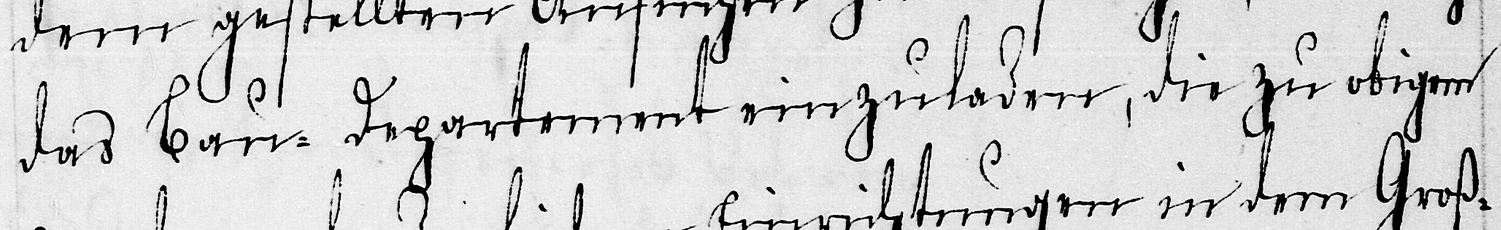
das Bau-Departement einzuladen, die zu obigem
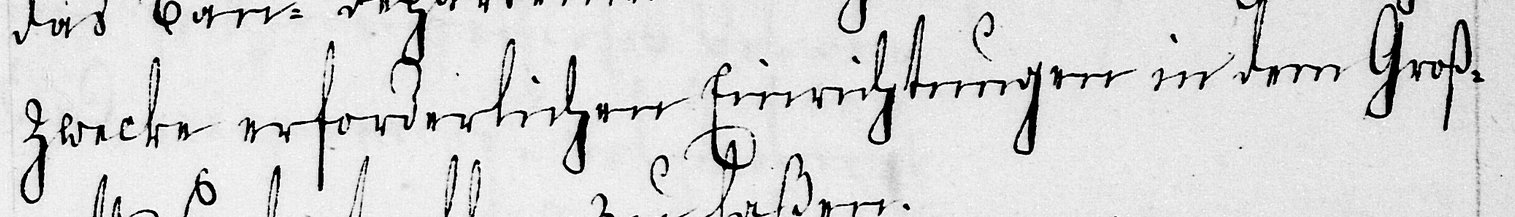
Zwecke erforderlichen Einrichtungen in dem Groß¬
